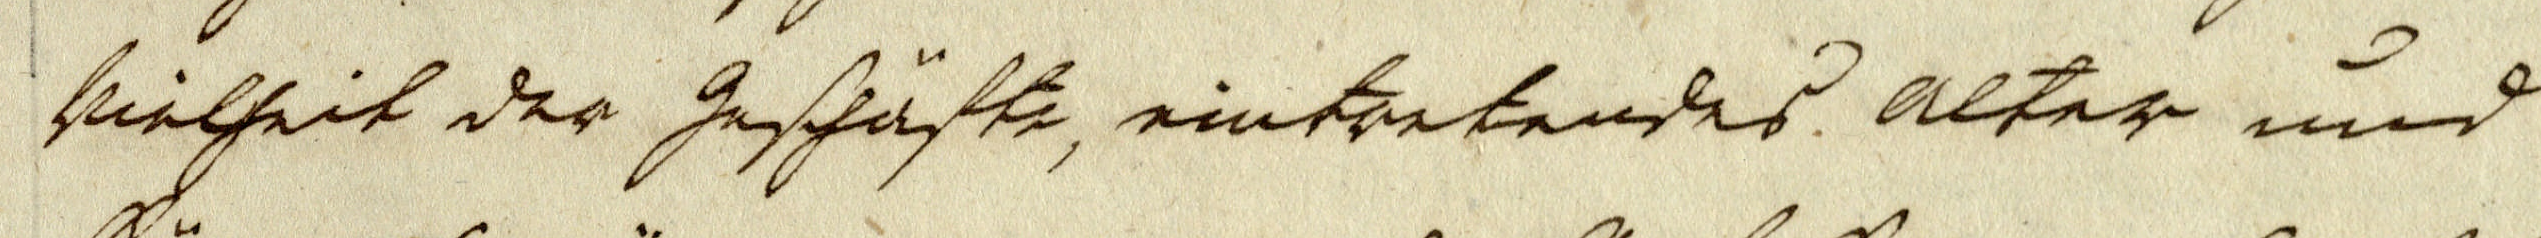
Vielheit der Geschäfte, eintretendes Alter und
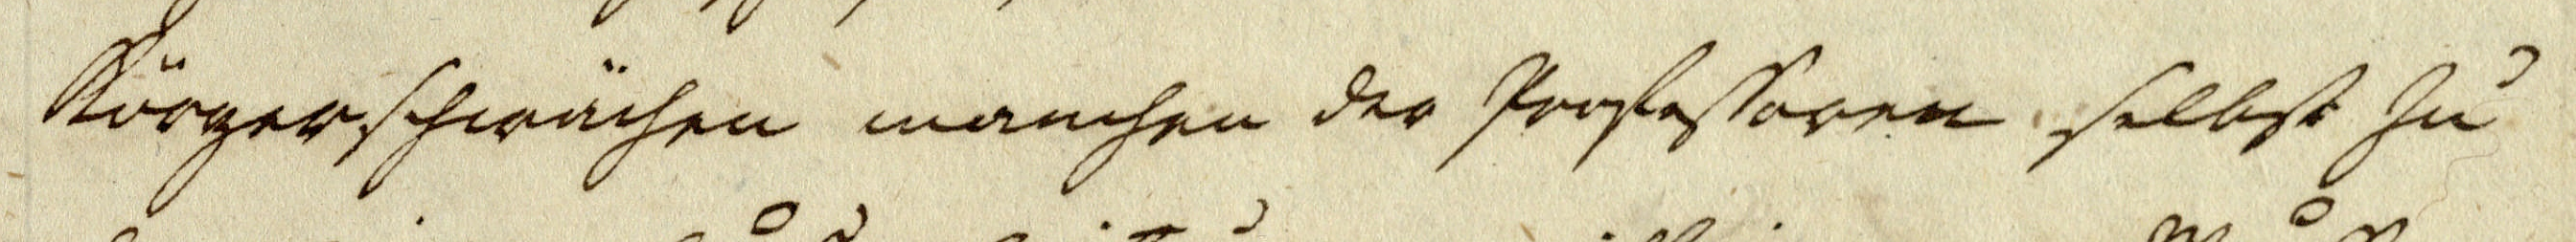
Körperschwächen manchen der Professoren selbst zu
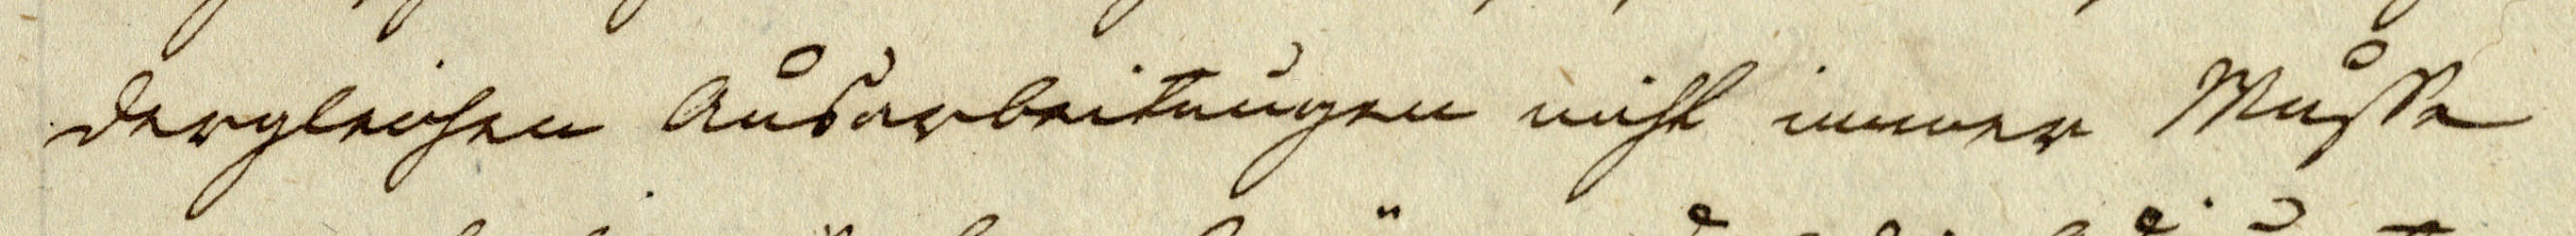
dergleichen Ausarbeitungen nicht immer Musse
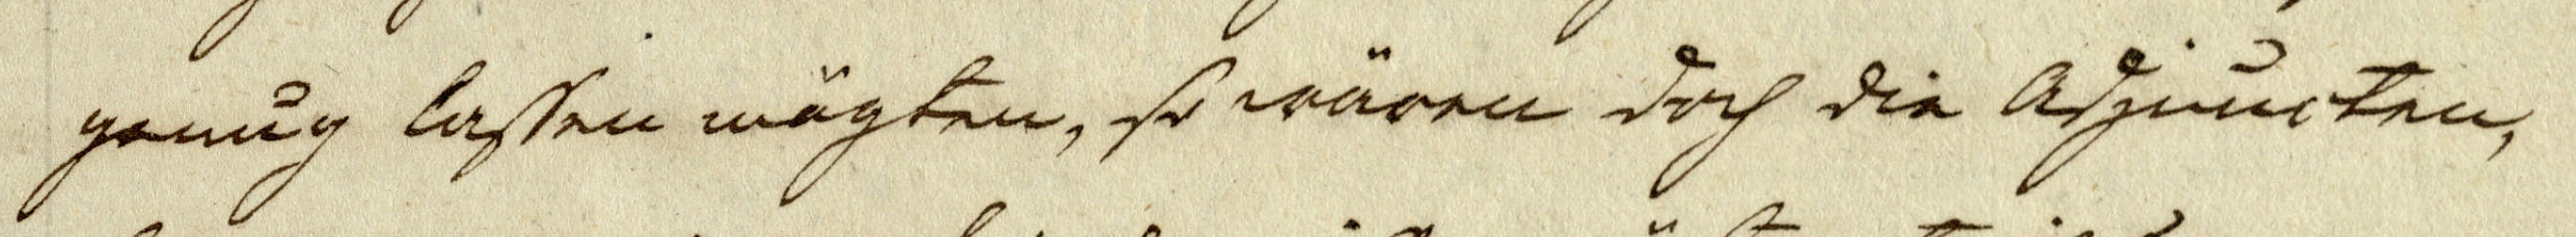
genug lassen mögten, so wären doch die Adjuncten,
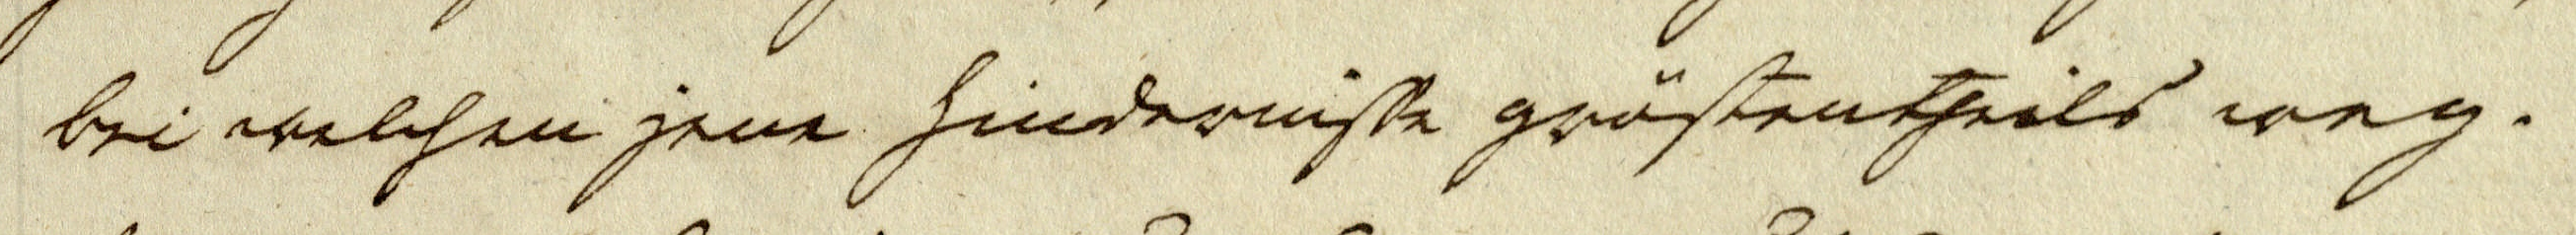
bei welchen jene Hindernisse gröstentheils weg¬
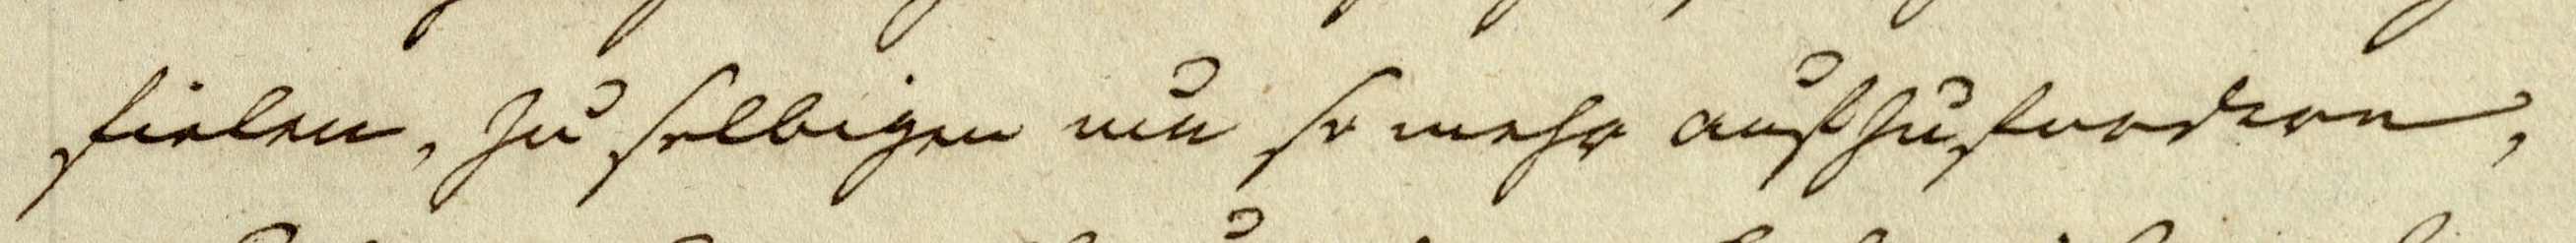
fielen, zu selbigen um so mehr aufzufordern,
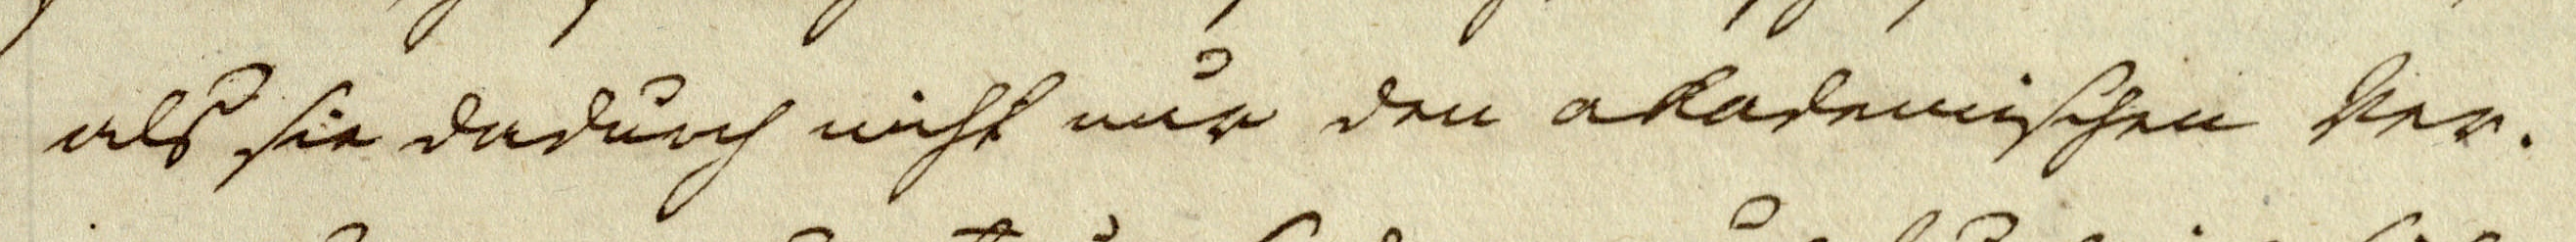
als sie dadurch nicht nur den akademischen Ver¬
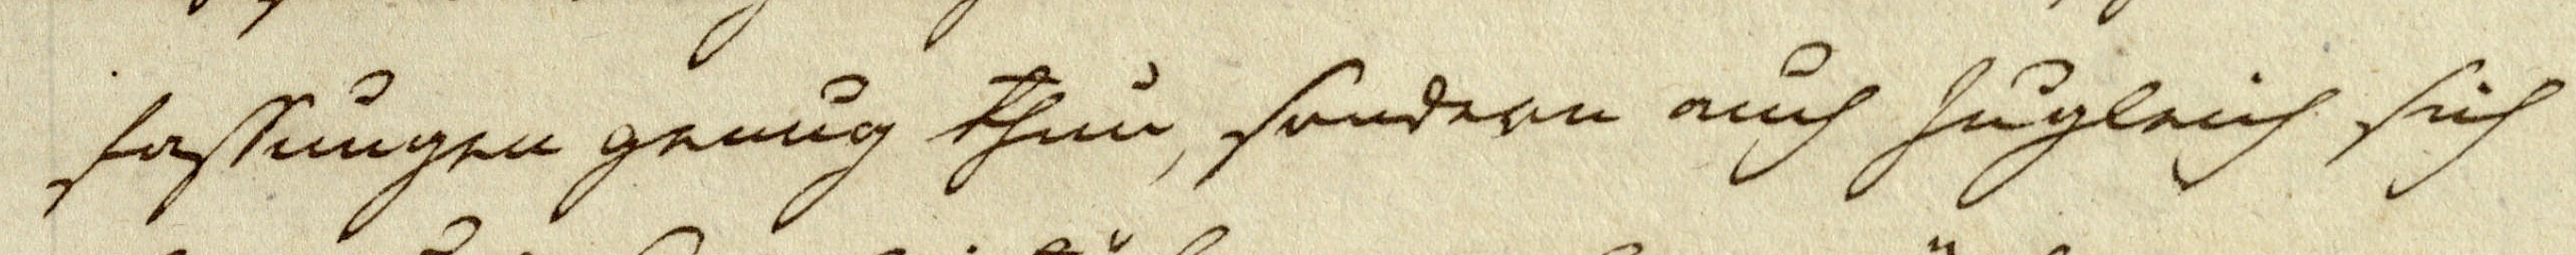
fassungen genug thun, sondern auch zugleich sich
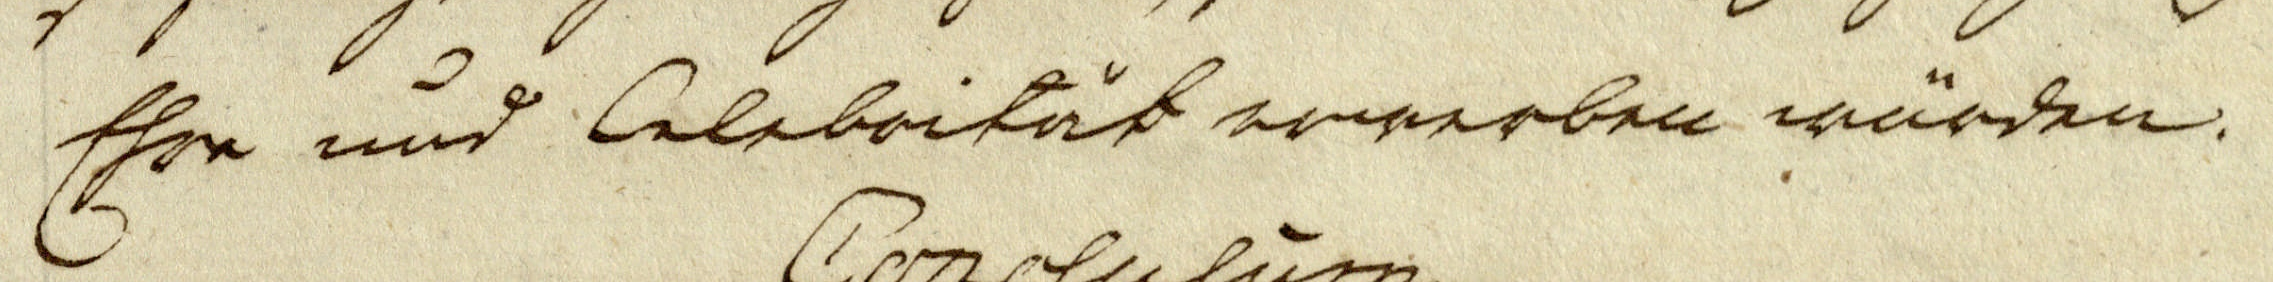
Ehre und Celebrität erwerben würden.
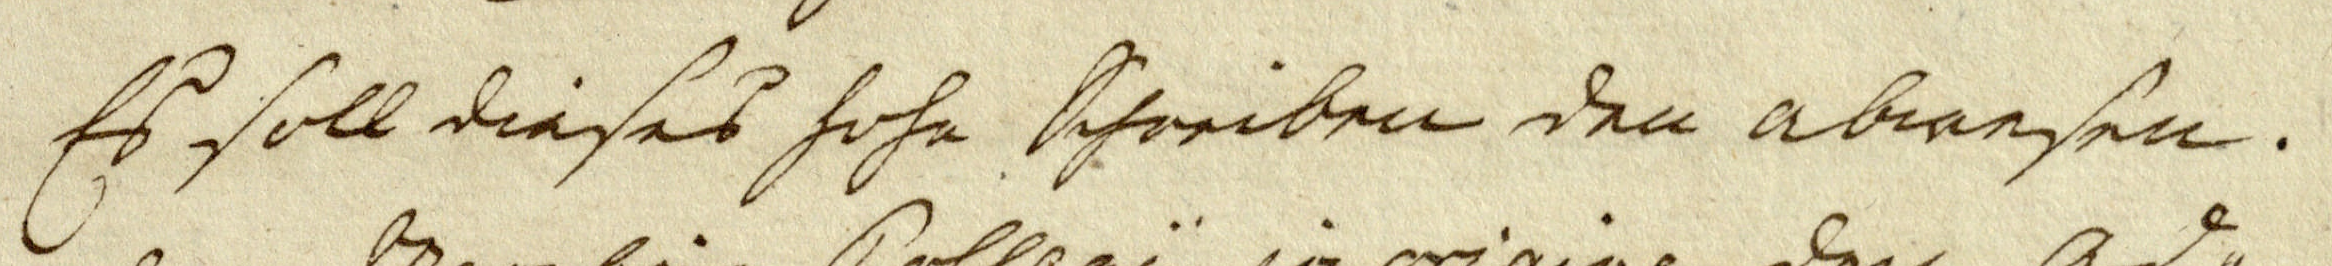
Es soll dieses hohe Schreiben den abwesen¬
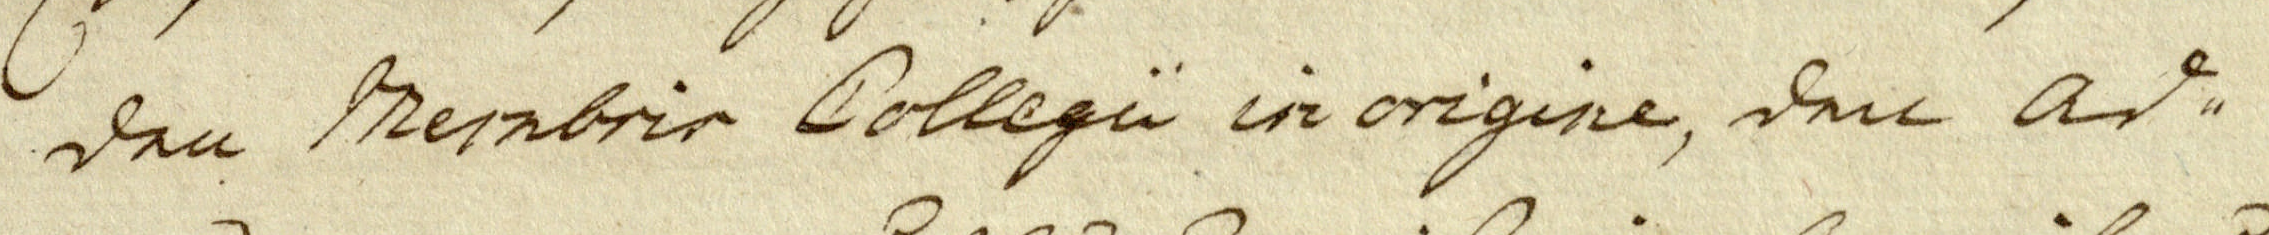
den Membris Collegii in origine, den Ad¬
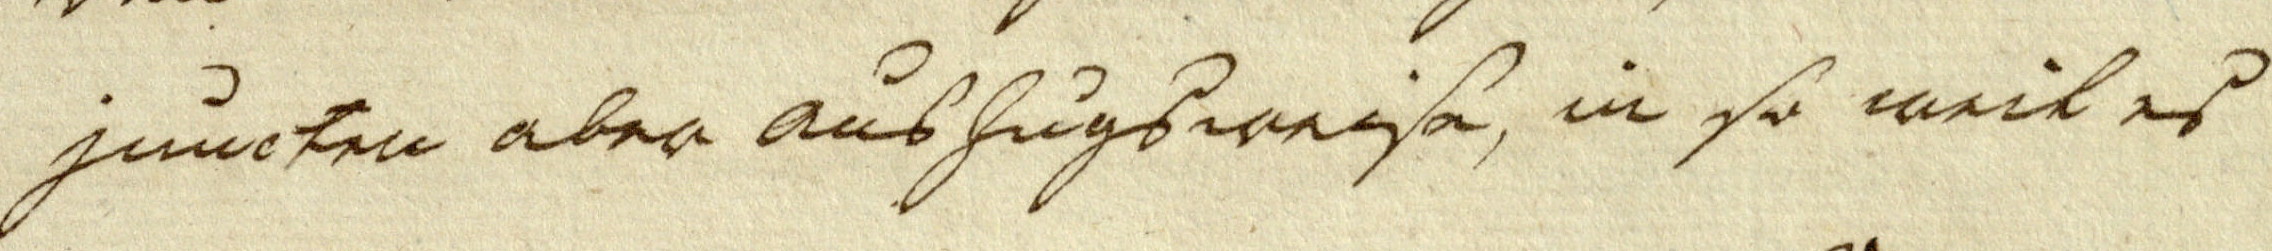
juncten aber auszugsweise, in so weit es
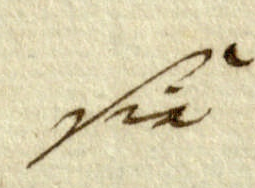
sie
